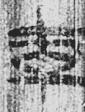車
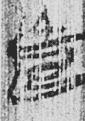良
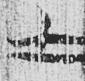士
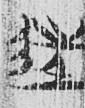往
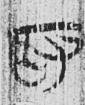取
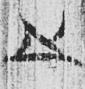之
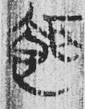餌（耳）
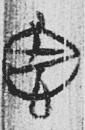思
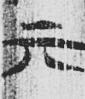亓
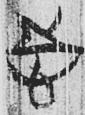志
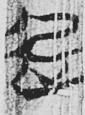○（起）
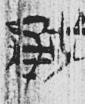○（勇）
